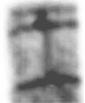王
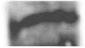一
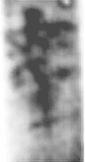𨍱（乘）
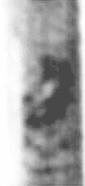○（路）
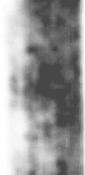車
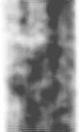麗
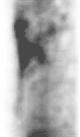匹
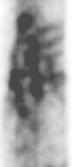駟
